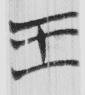王
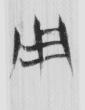用
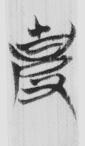尅
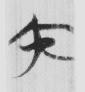內
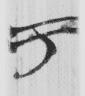于
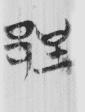郢
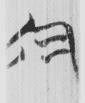今
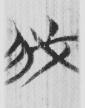我
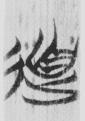道
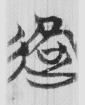{辶各}
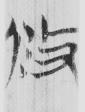攸
